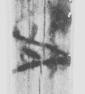之
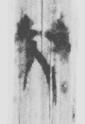大
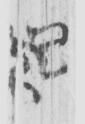紀
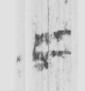上
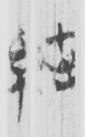總
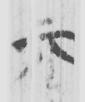亓
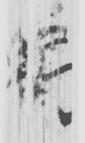紀
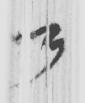乃
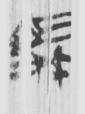{馬午}
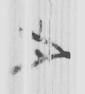之
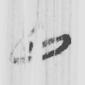㠯（以）
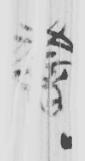{爻言}
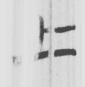上
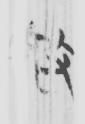{它攴}
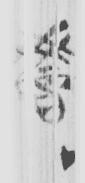{爻言}
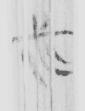必
